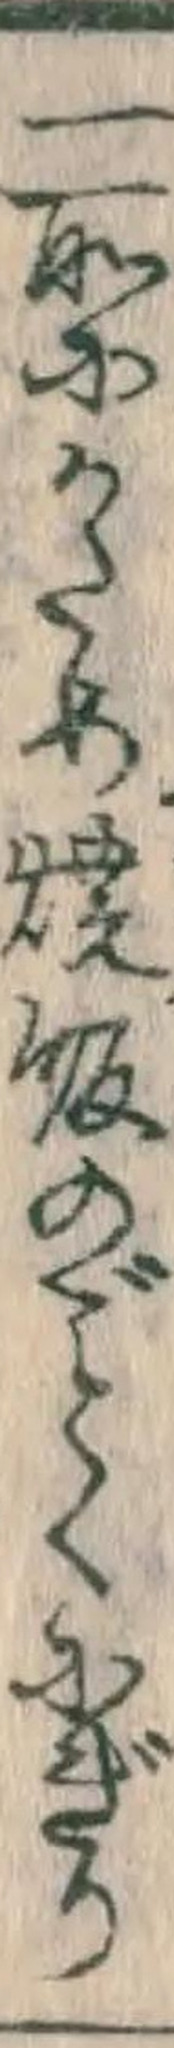一所にかため焼飯のごとくにぎり
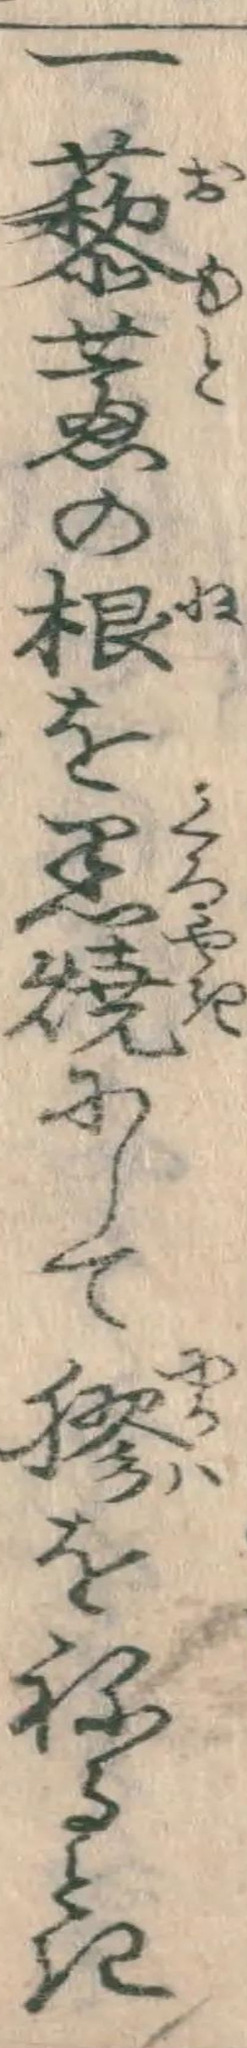一藜藘の根を黒焼にして膠をねるとき
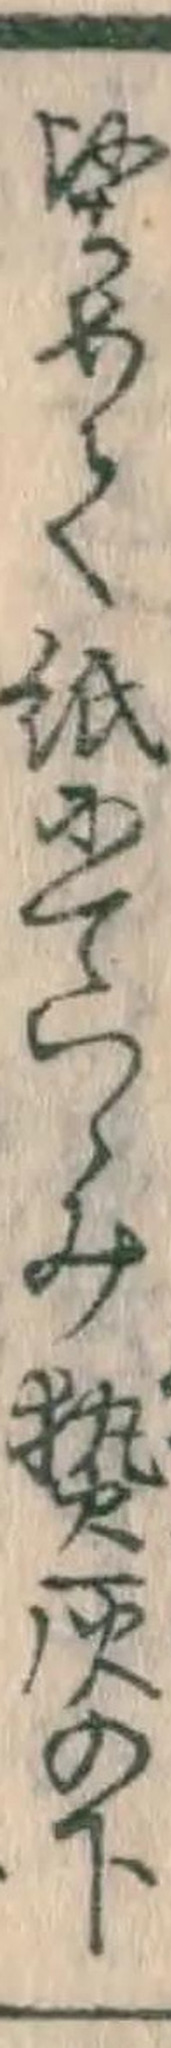堅めて紙にてつゝみ熱灰の下
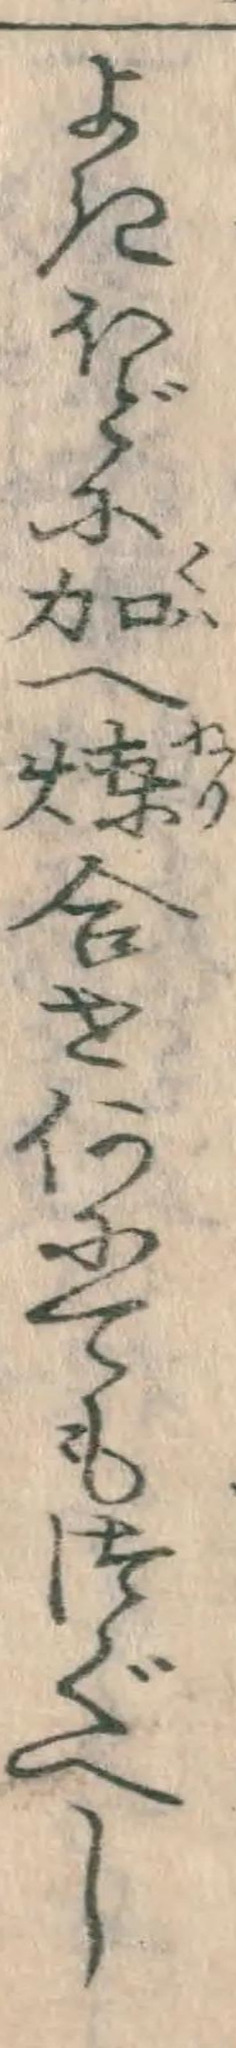よきほどに加へ煉合せ何にてもつぐへし
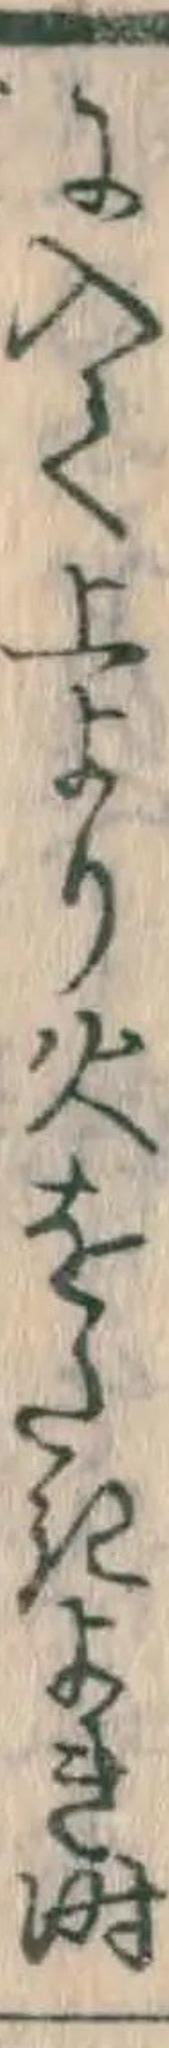に入て上より火をたきよき時
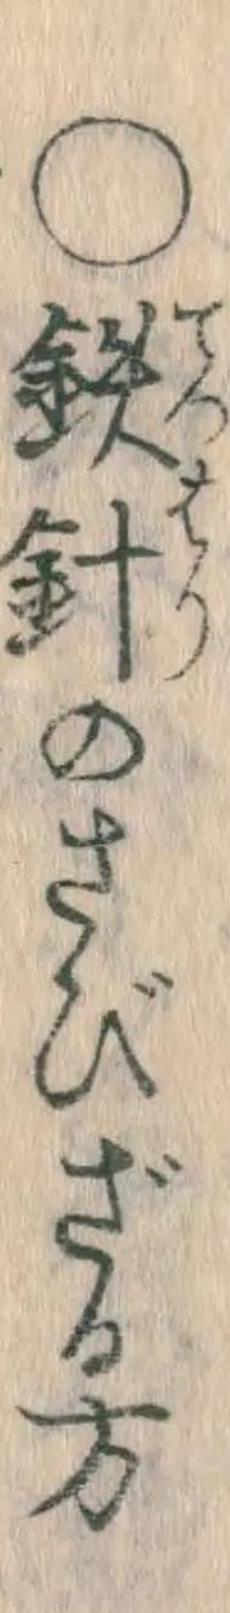○鉄針のさびざる方
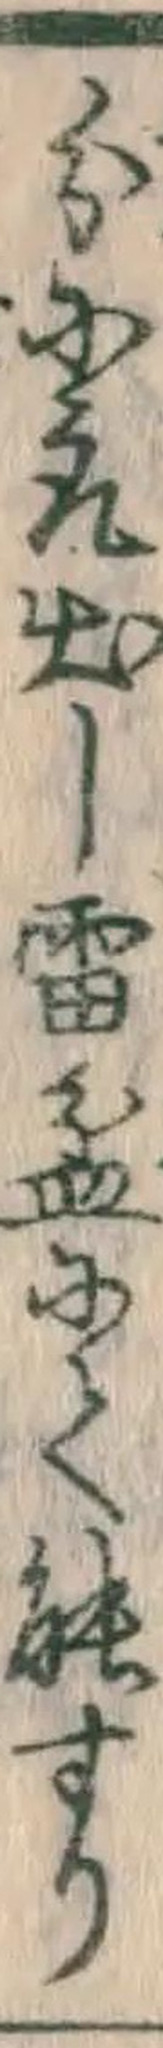分に取出し雷盆にて能すり
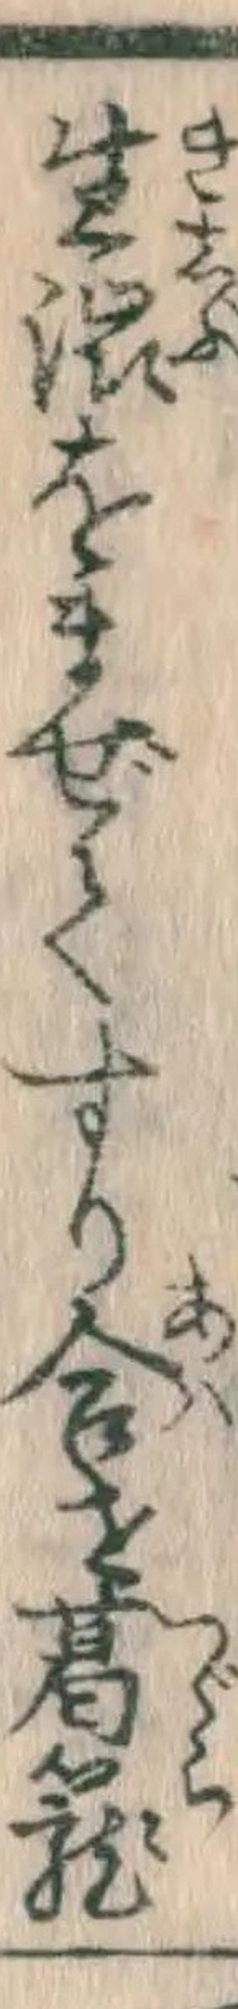生渋をまぜてすり合せ葛籠
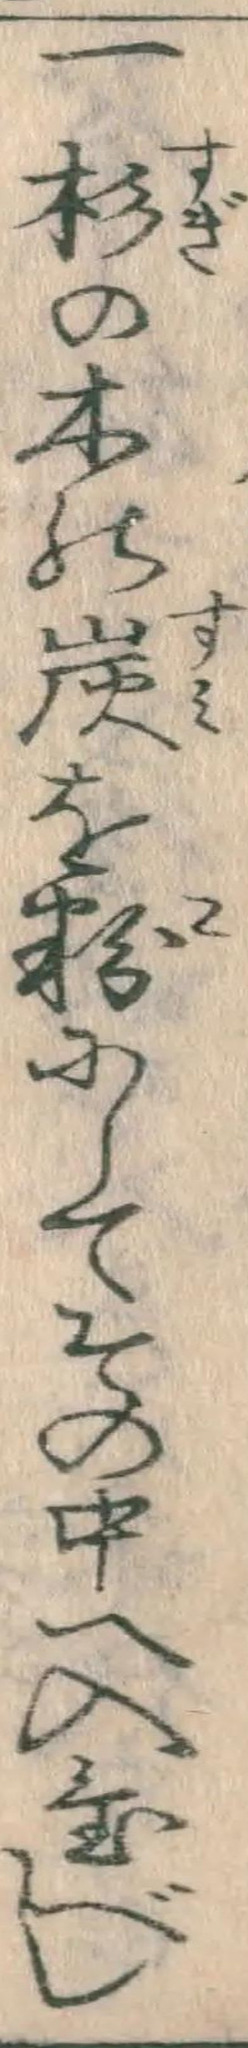一杉の木の炭を粉にしてその中へ入置べし
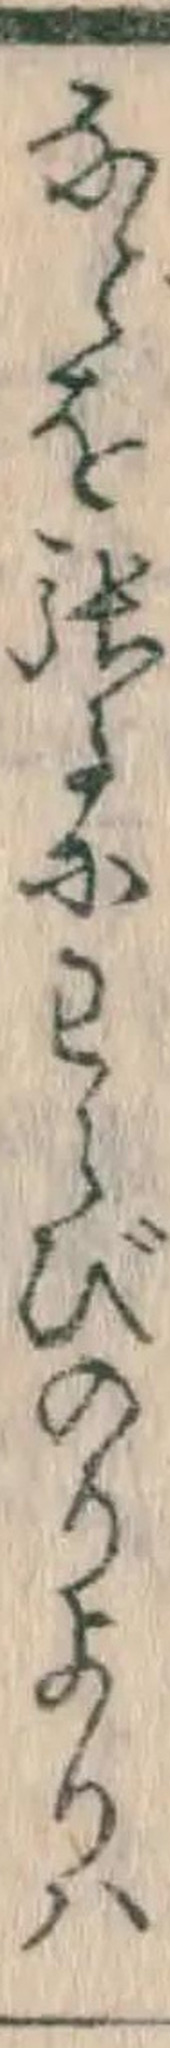などを張るにわらびのりよりは
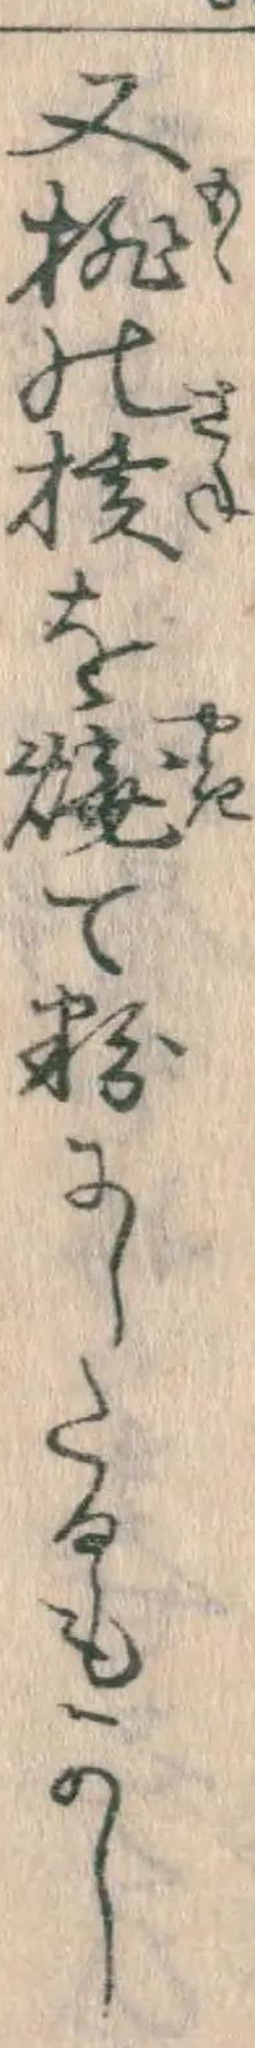又桃の核を焼て粉にしたるもよし
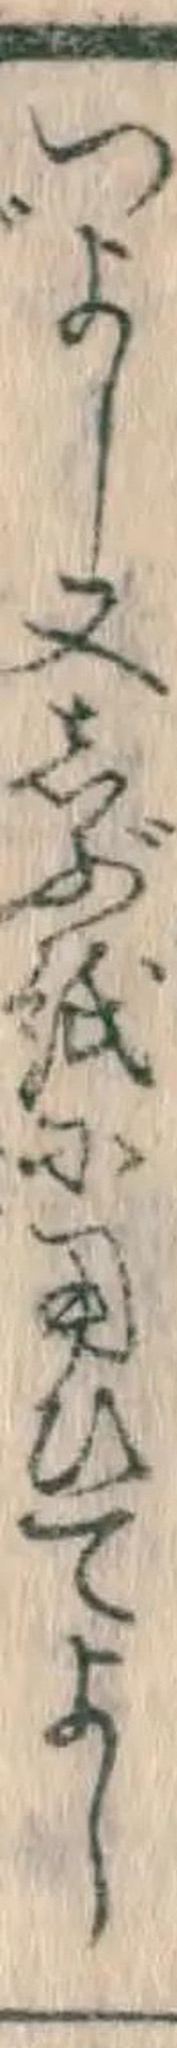つよし又しぶ紙に用ひてよし
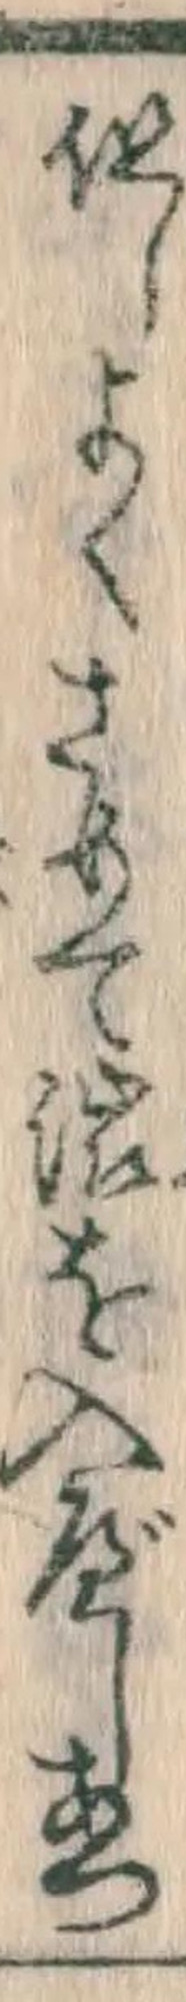但しよくさめて渋を入べしあつ
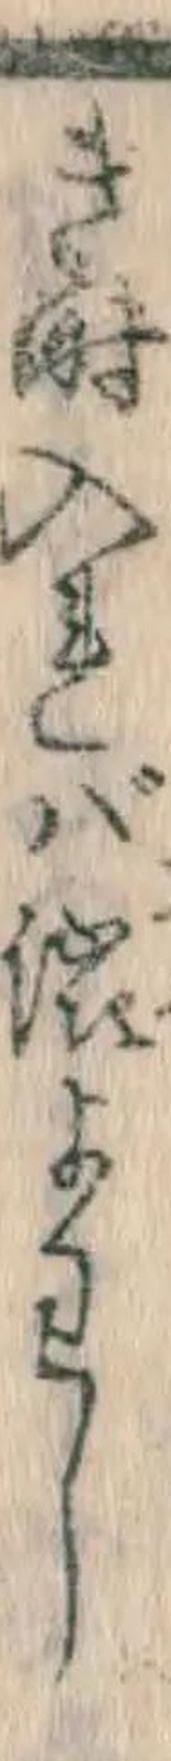き時入れば渋よわし
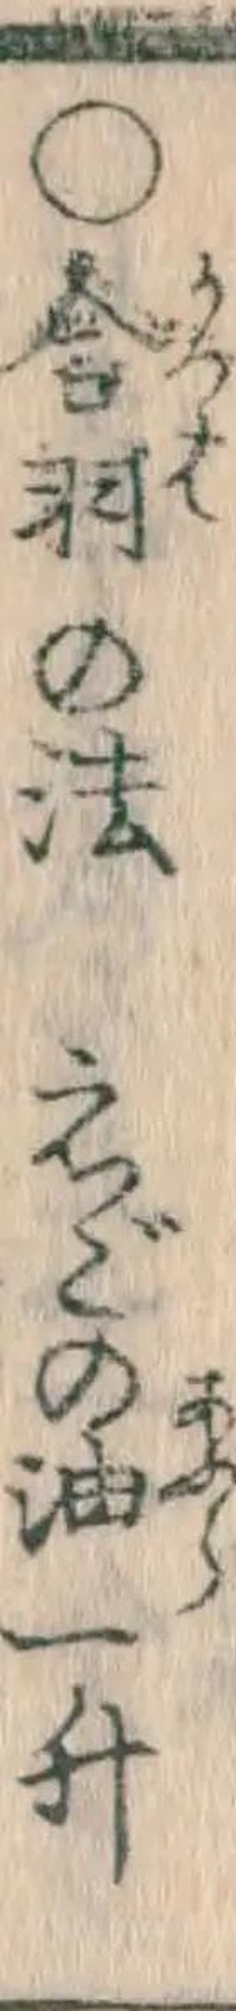○合羽の法えごの油一升
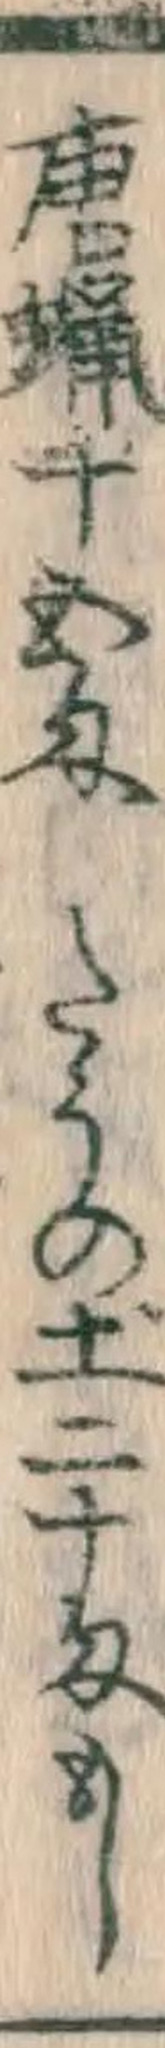唐蝋十五匁たうの土二十匁もし
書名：広益秘事大全 3巻. [2]
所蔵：国立国会図書館 National Diet Library, JAPAN
